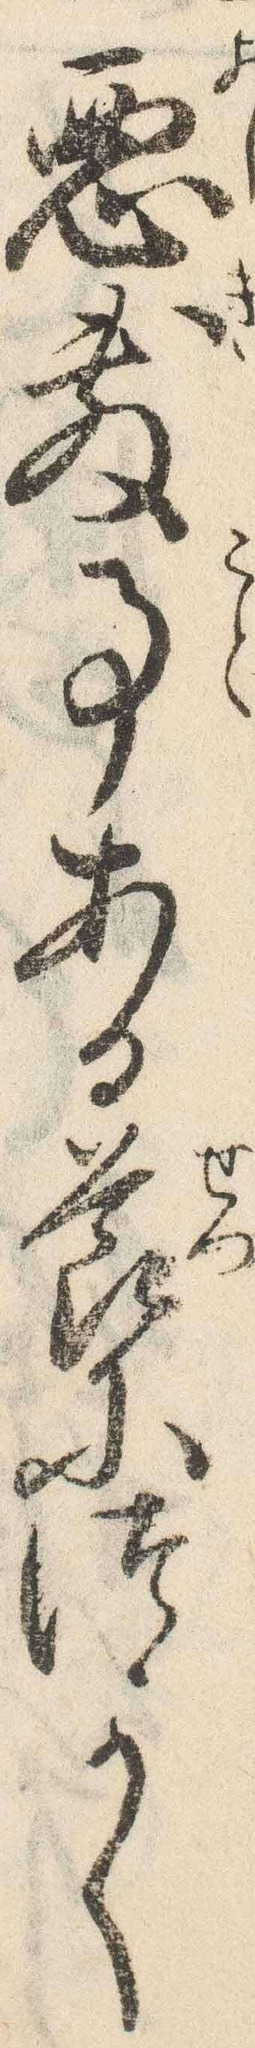悪敷事ある節につよく
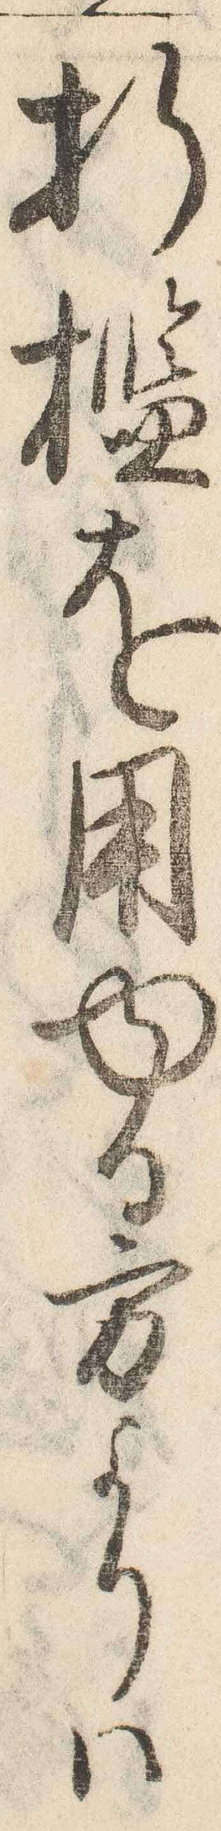折檻を用ゆる方よりは
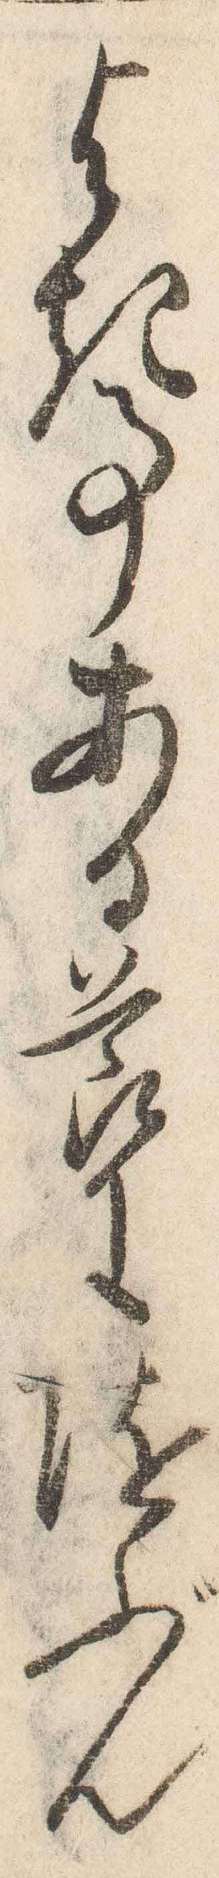よき事ある節に随ぶん
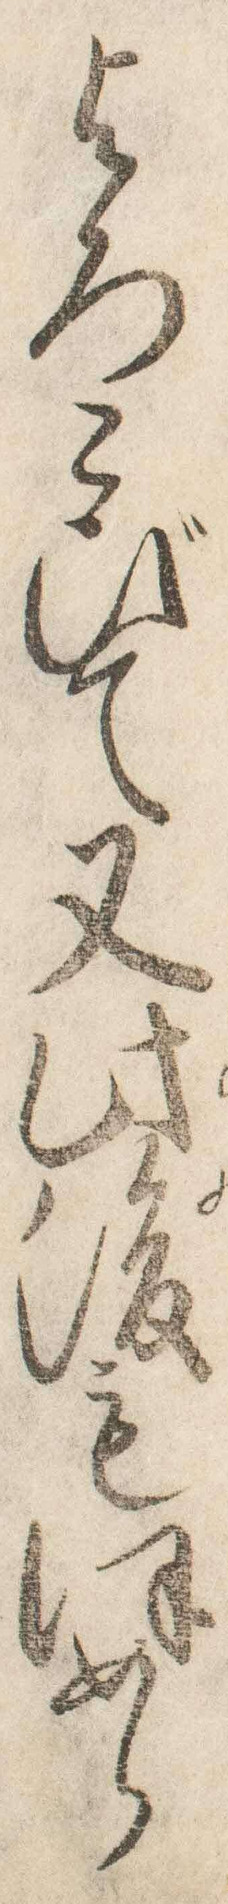よろこびて又此後もほめら
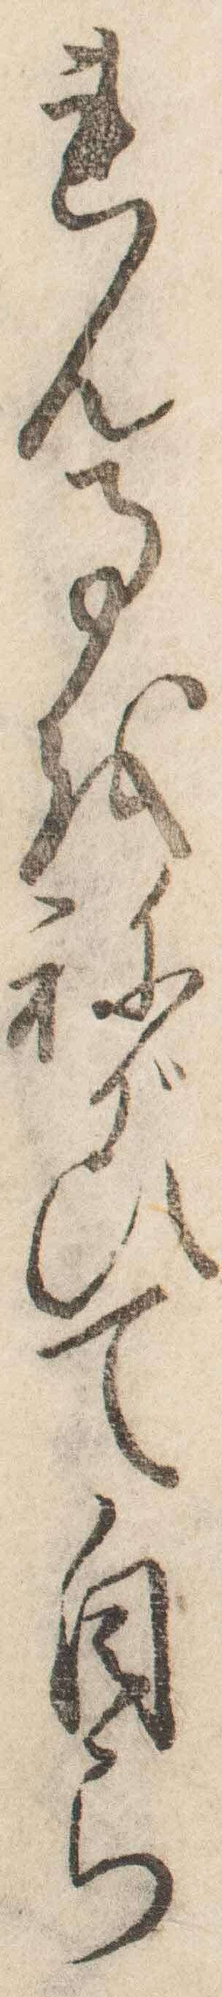れん事をねがひて自ら

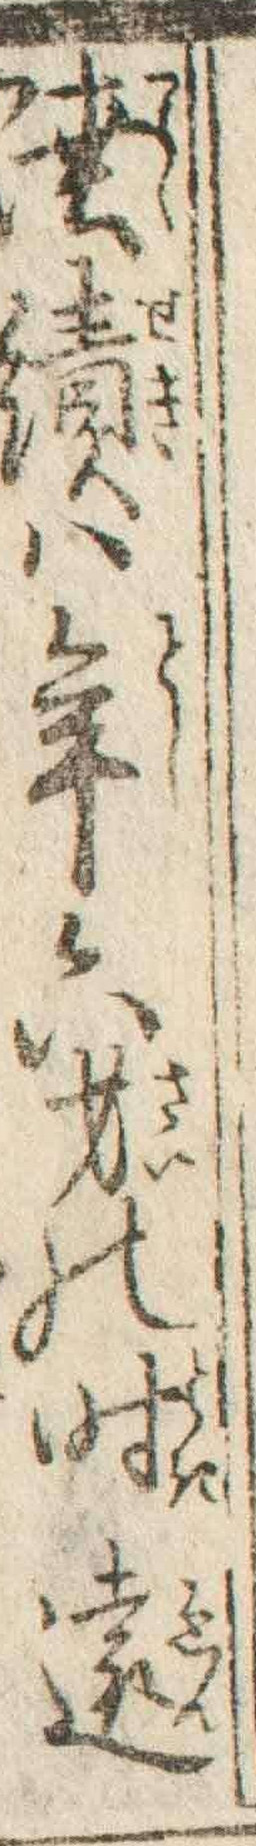陸績は年六才の時遠
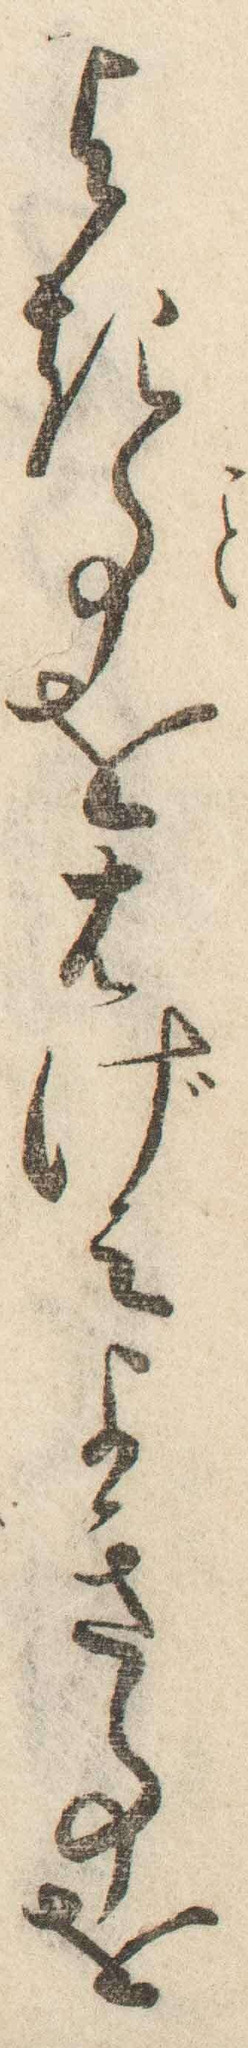よき事はげみよき事を
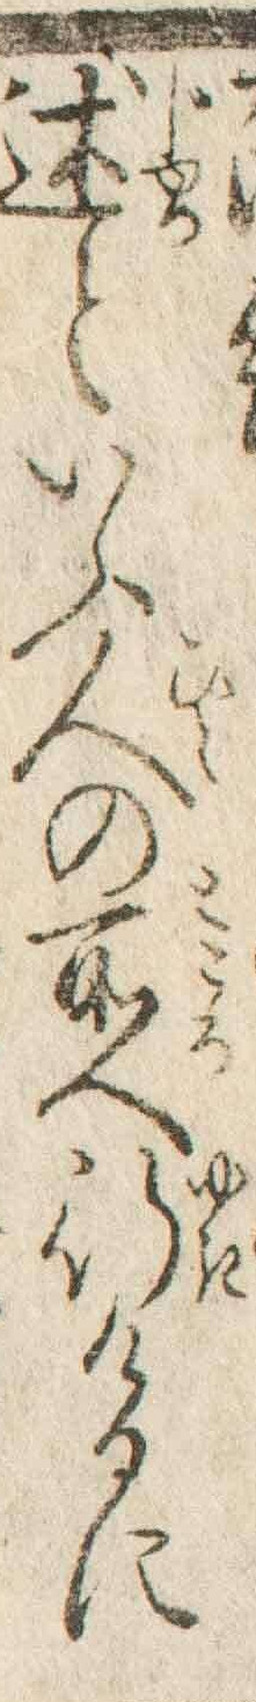述といふ人の所行けるに
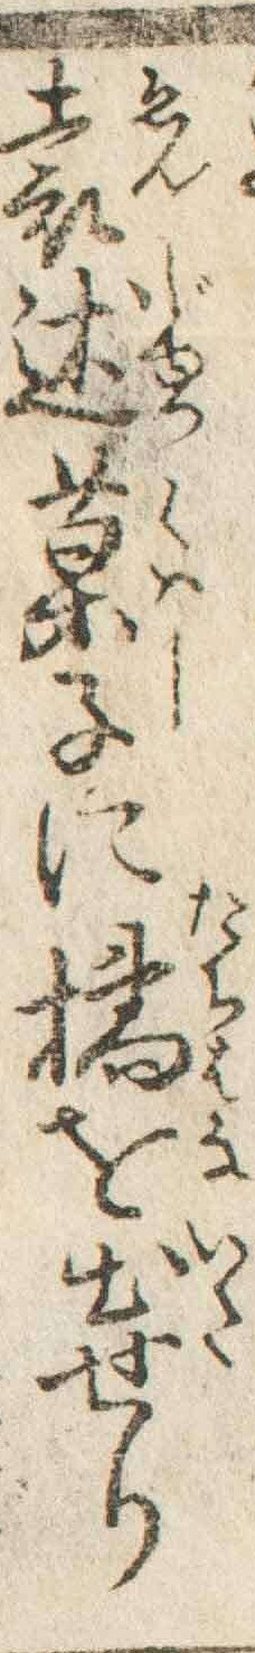袁述菓子に橘を出せり
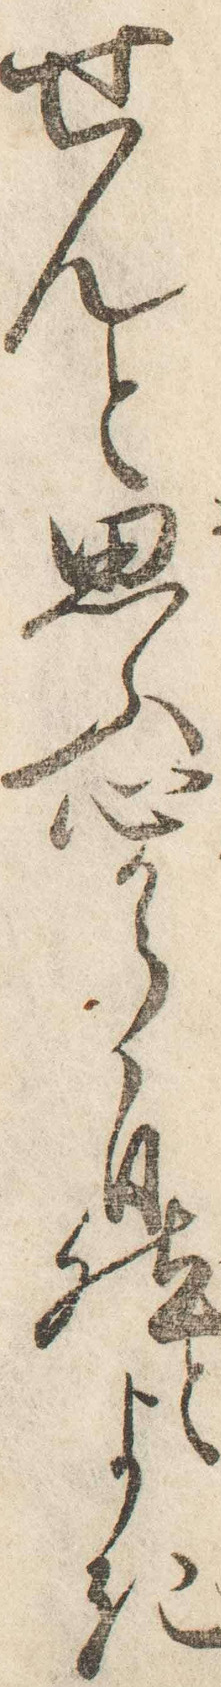せんと思ふ心から自然とよき
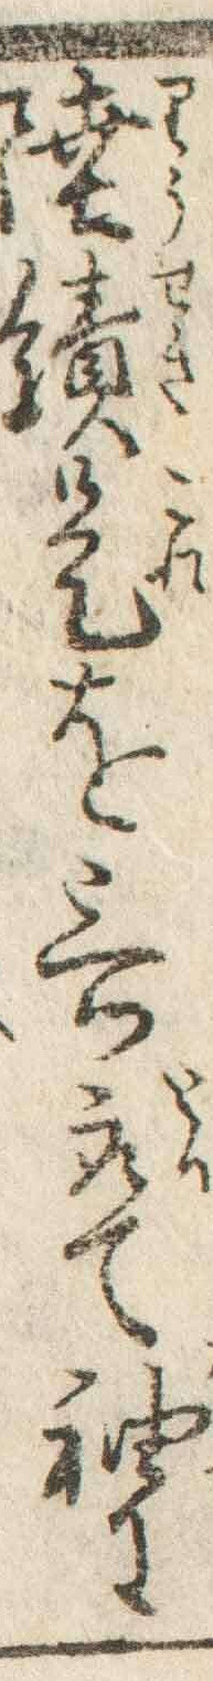陸績是を三つ取て袖に
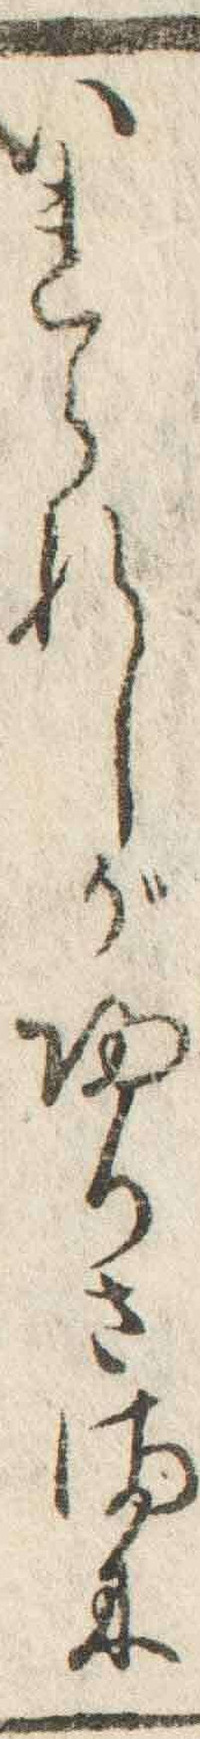いれられしが帰りさまに
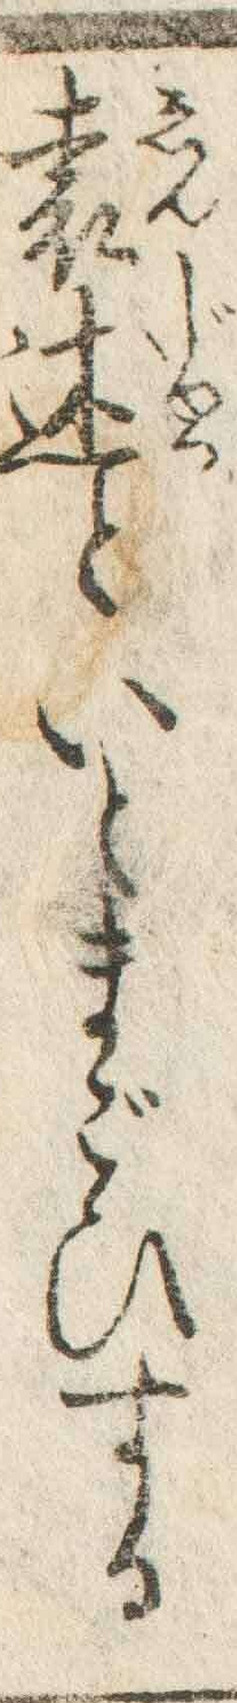袁述といとまごひする
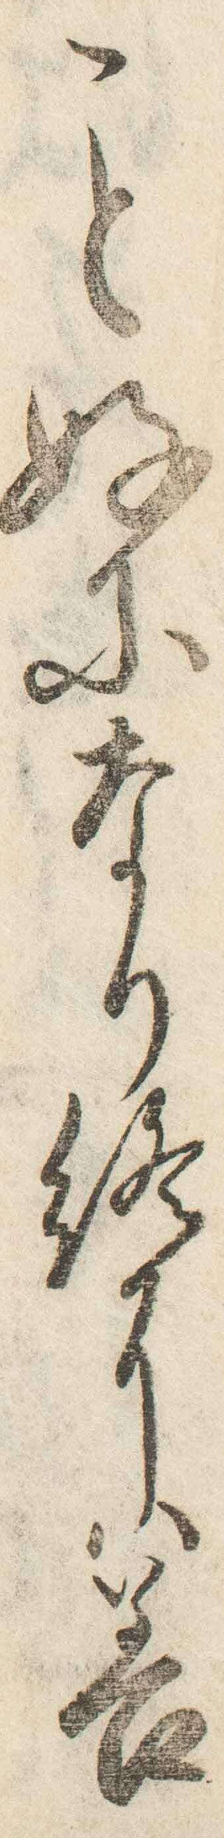こと好になり終には善
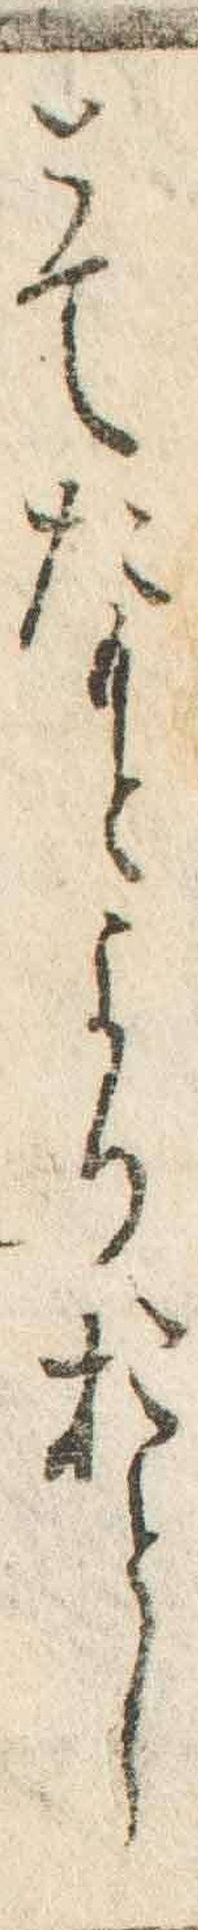とてたもとよりおとし
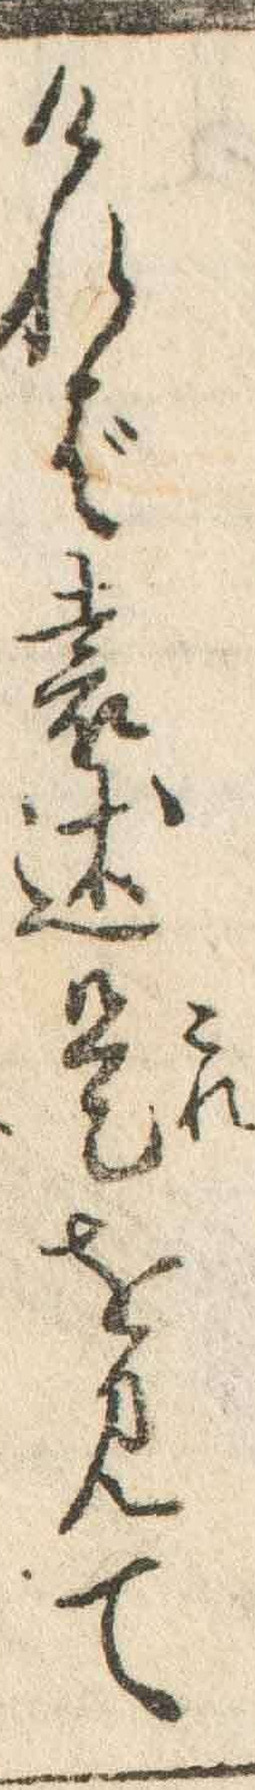ければ袁述是を見て
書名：撫育草
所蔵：東京学芸大学附属図書館 国文学研究資料館
